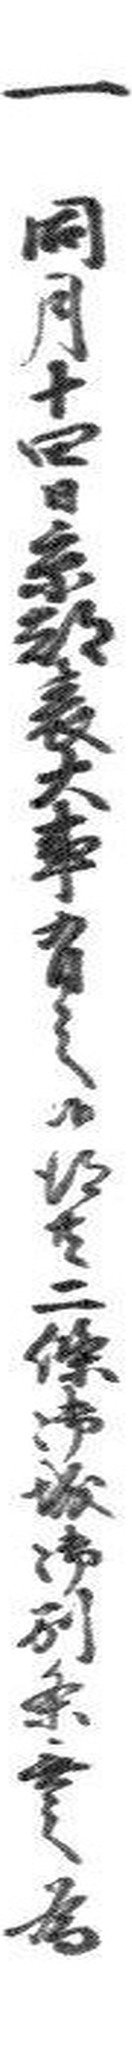一同月十四日京都表大事有之候得共二條御城御別条無之為

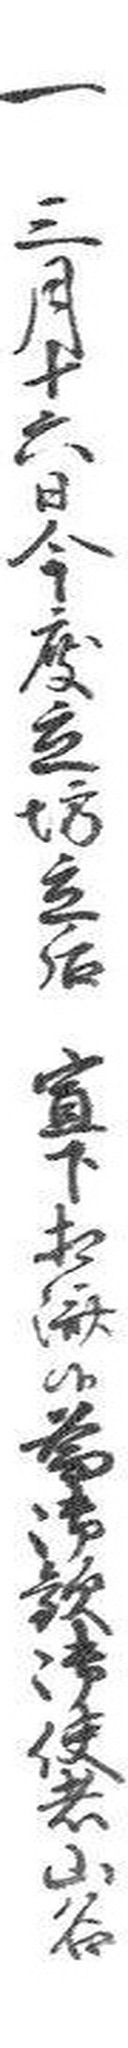一三月十六日今度立坊立后宣下相済候為御歓御使者山名
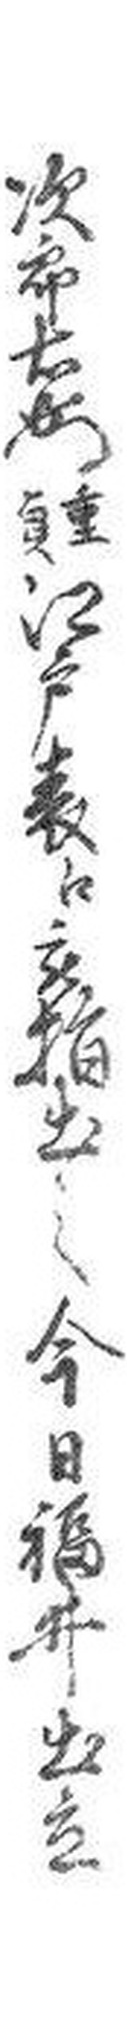次郎右衛門重貞江戸表江被指出之今日福井出立
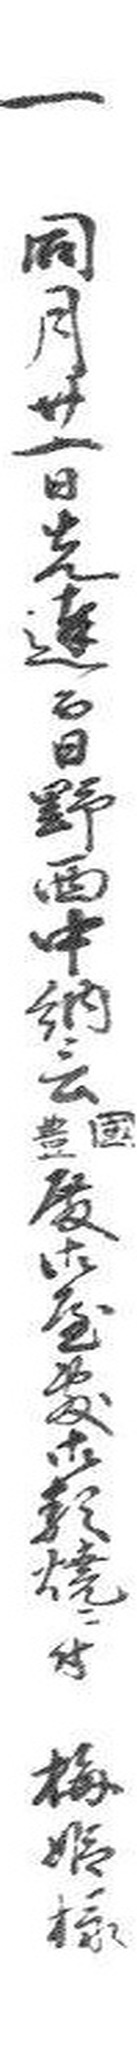一同月廿一日先達而日野西中納言国豊殿御屋敷御類焼ニ付梅姫様
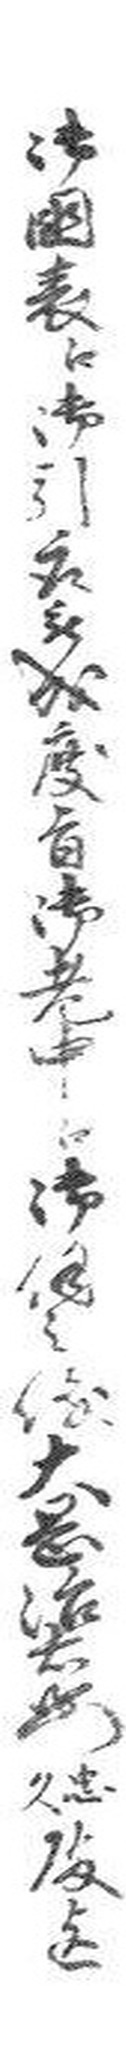御国表江御引取被成度旨御老中江御伺之儀大岡治右衛門忠久殿迄
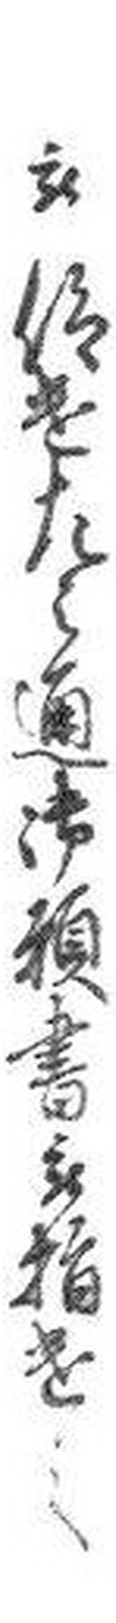被仰遣左之通御願書被指遣之
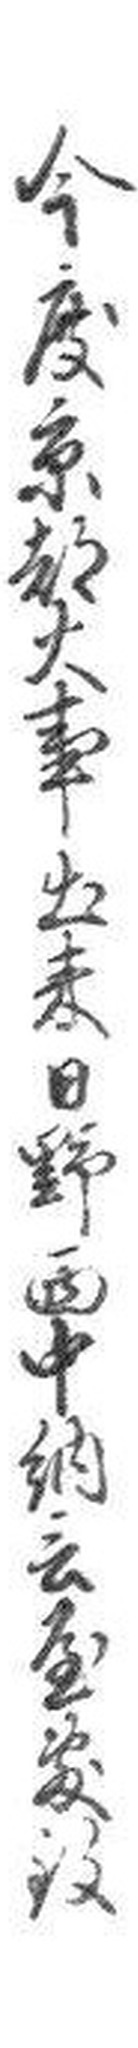今度京都大事出来日野西中納言屋敷致
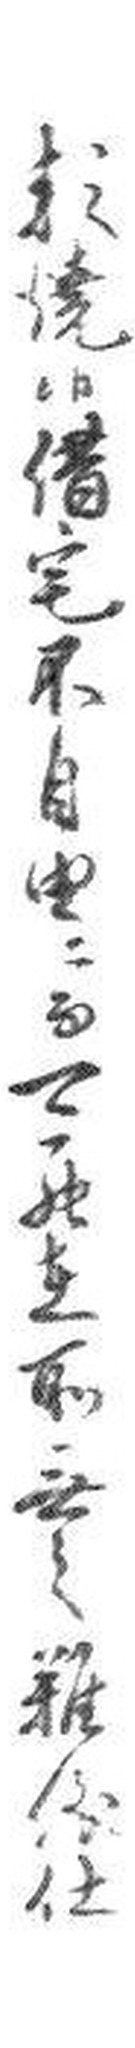類焼候借宅不自由ニ而可罷在所無之難儀仕
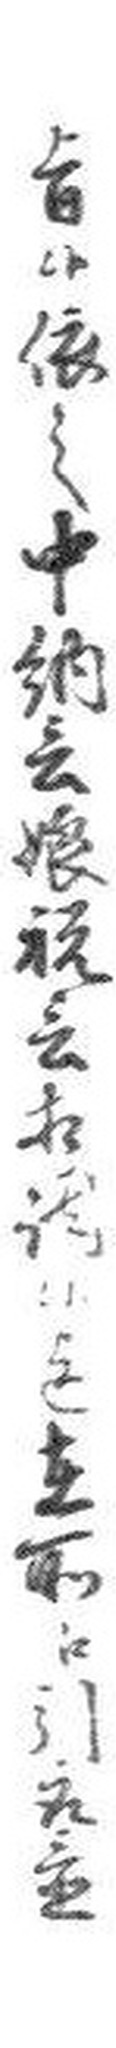旨候依之中納言娘祝言相調候迄在所江引取置
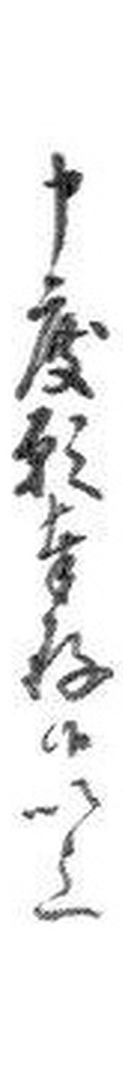申度願奉存候以上
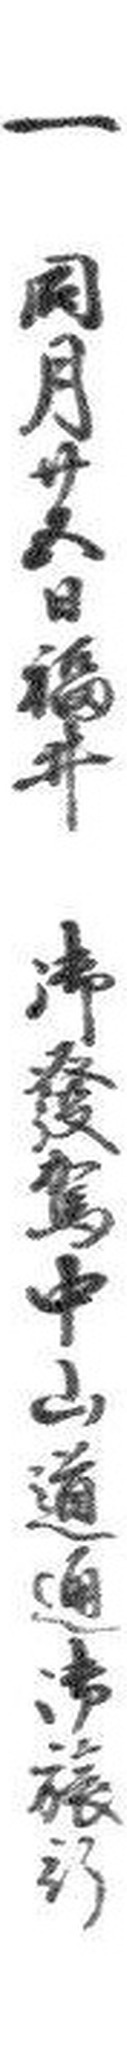一同月廿五日福井御発駕中山道通御旅行
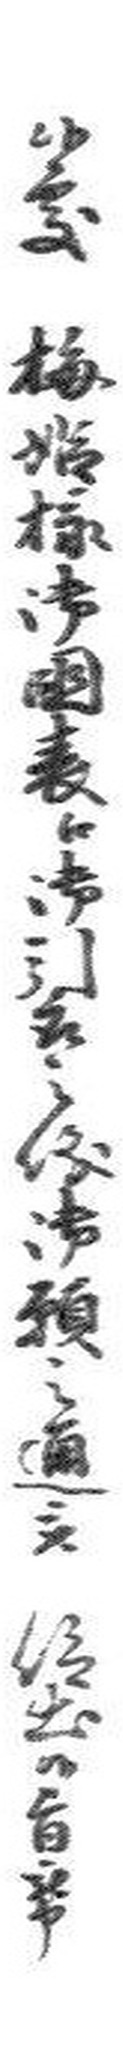候処梅姫様御国許江御引取之儀御願之通被仰出候旨被申
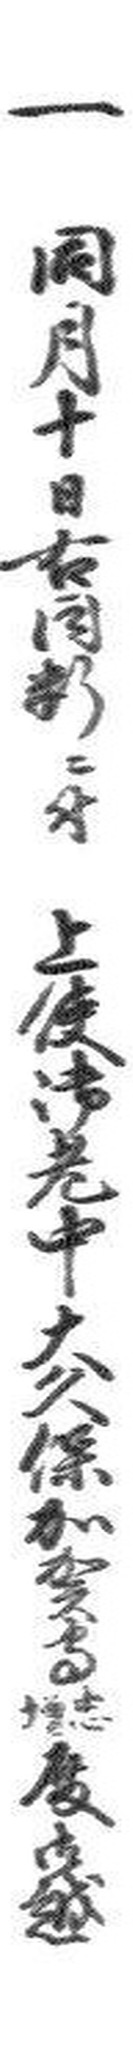一同月十日右同断ニ付上使御老中大久保加賀守忠増殿御越

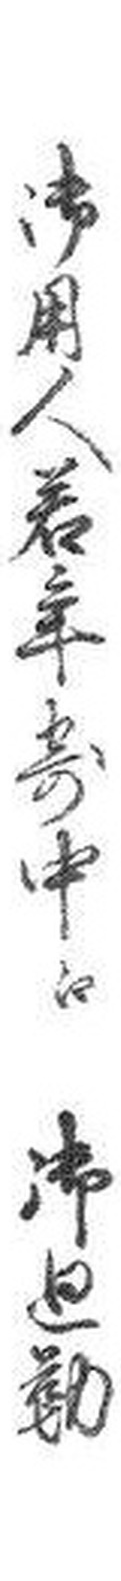御用人若年寄中江御廻勤
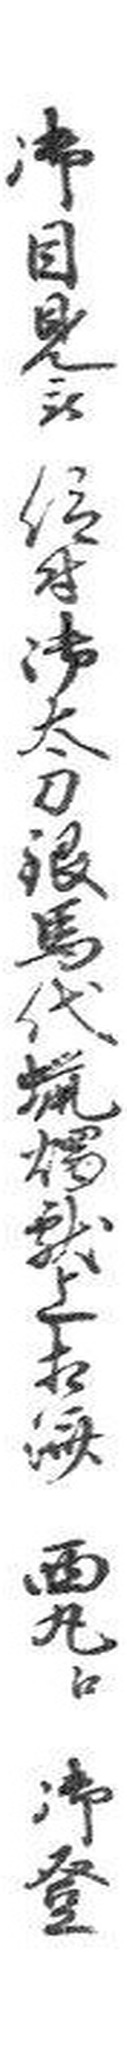御目見被仰付御太刀銀馬代蝋燭献上相済西丸江御登
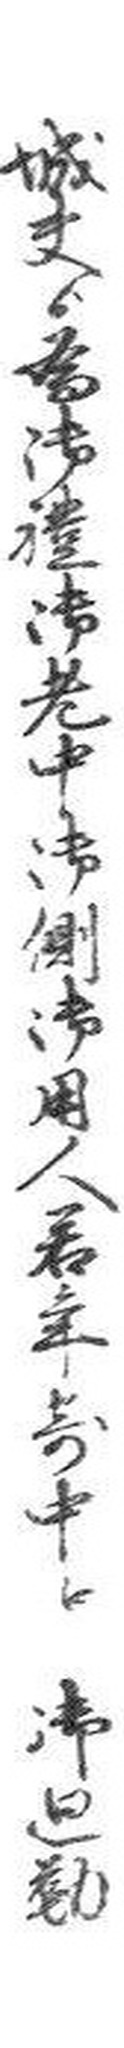城夫ゟ為御礼御老中御側御用人若年寄中江御廻勤
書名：家譜 二十四 吉品公 従宝永三年到同五年
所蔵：福井県文書館 Fukui Prefectural Archives
